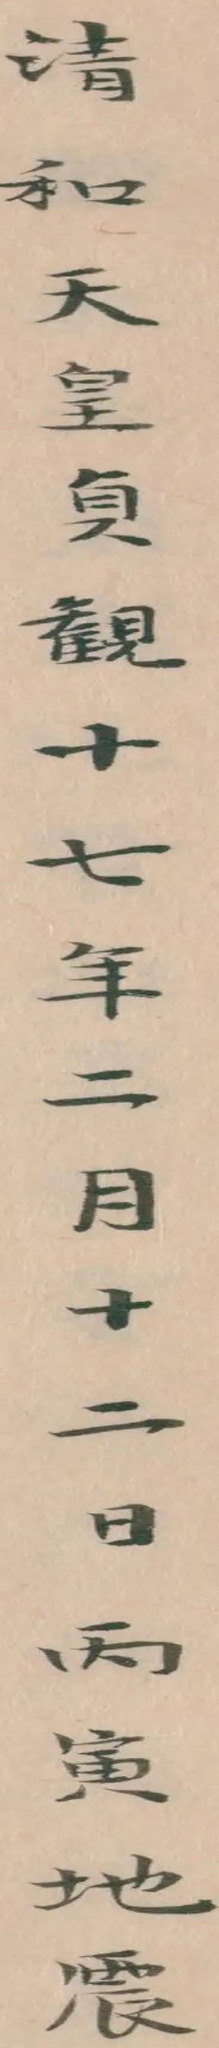清和天皇貞観十七年二月十二日丙寅地震
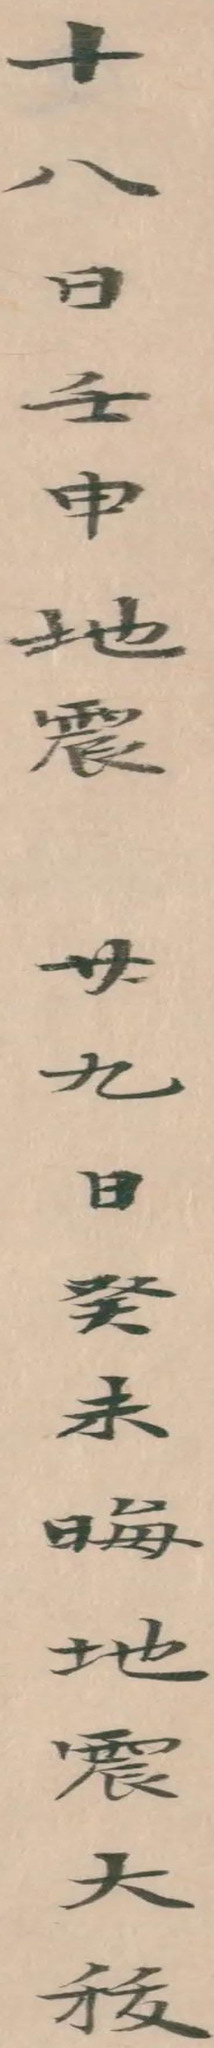十八日壬申地震廿九日癸未晦地震大祓
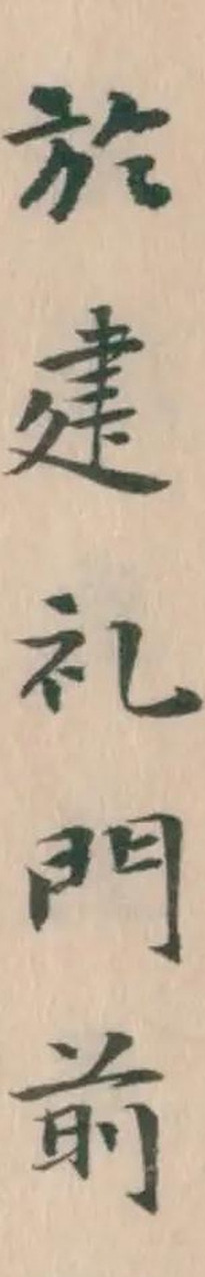於建礼門前
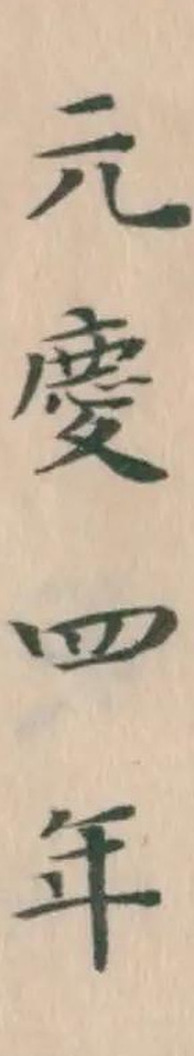元慶四年
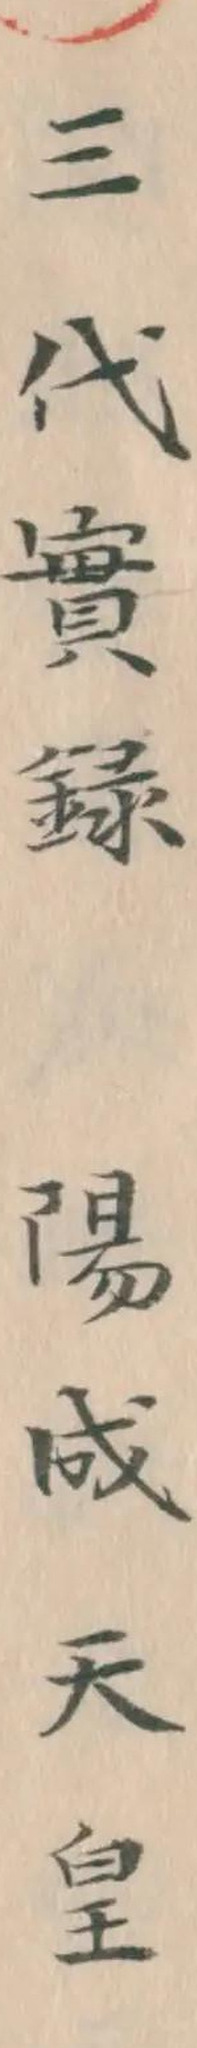○三代実録陽成天皇
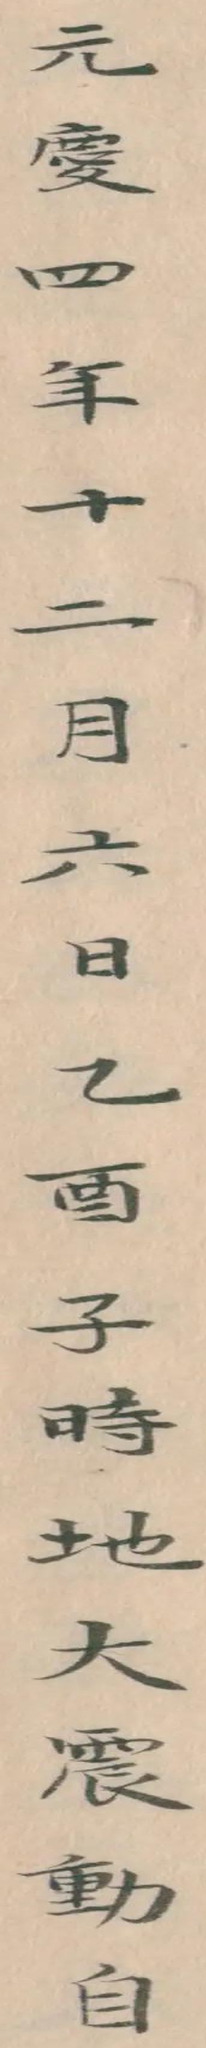元慶四年十二月六日乙酉子時地大震動自

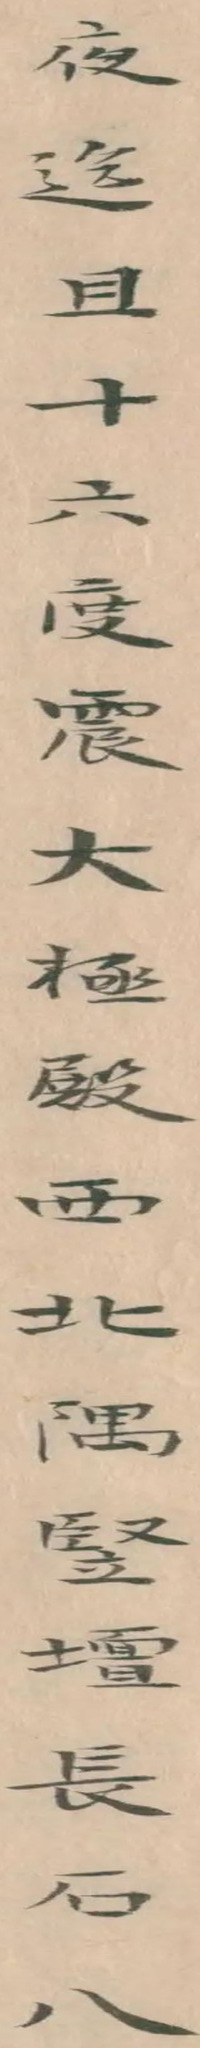夜迄且十六度震大極殿西北隅竪壇長石八
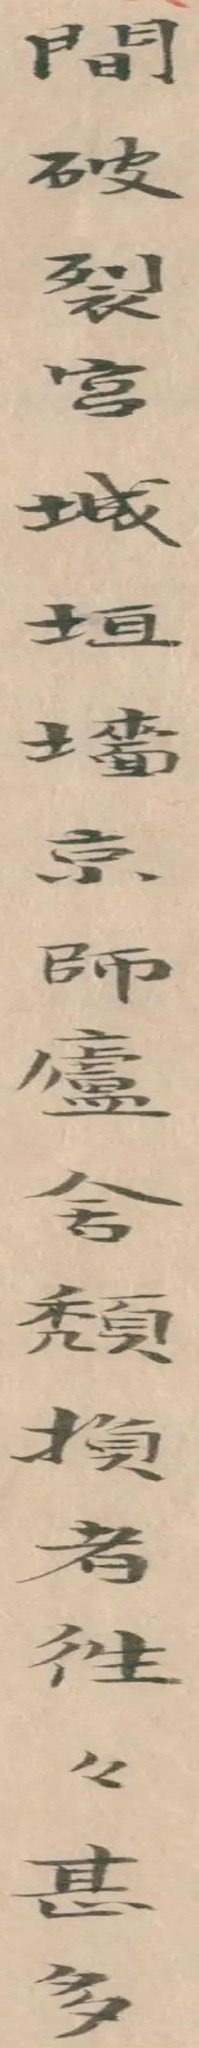間破裂宮城垣墻京師廬舎頽損者往々甚多
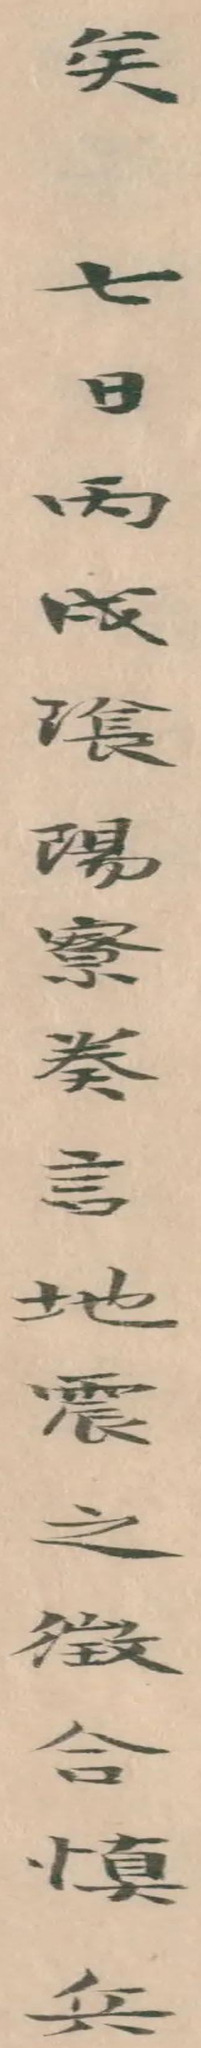矣七日丙戌陰陽寮奏言地震之徴合慎兵
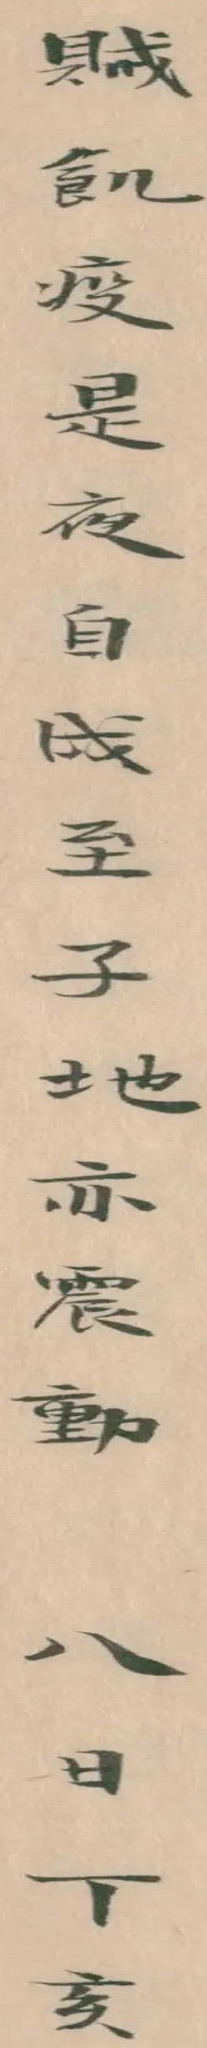賊飢疫是夜自戌至子地亦震動八日丁亥
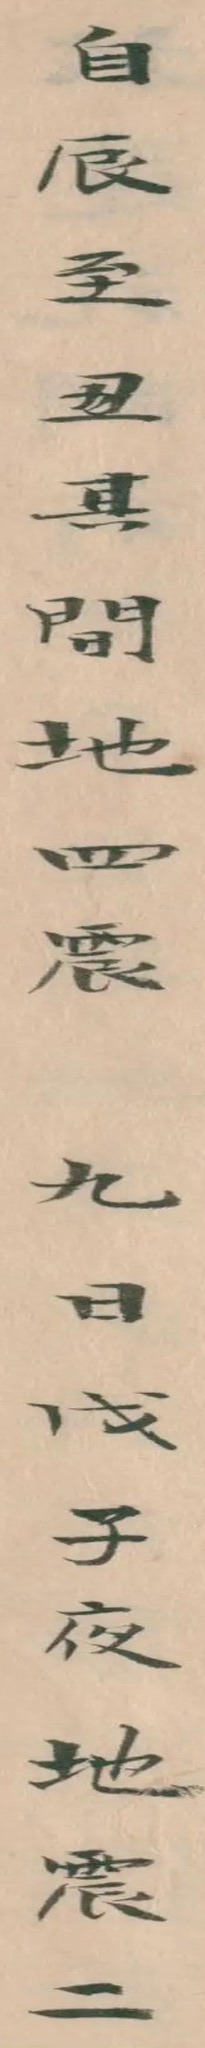自辰至丑其間地四震九日戊子夜地震二
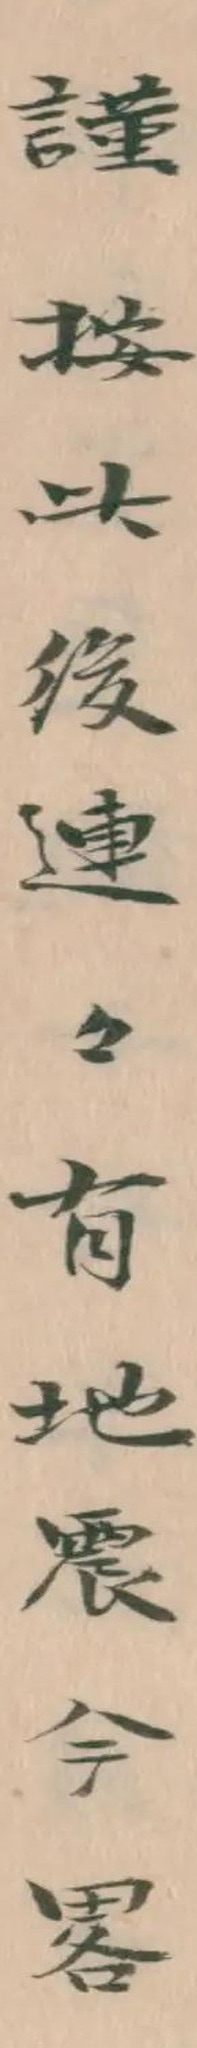謹按此後連々有地震今略
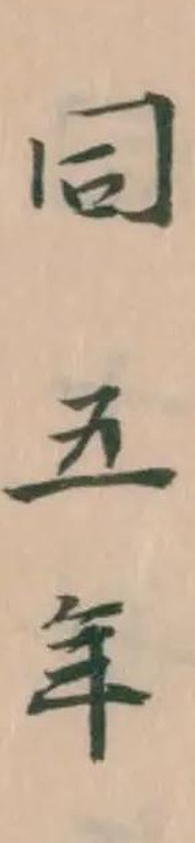同五年
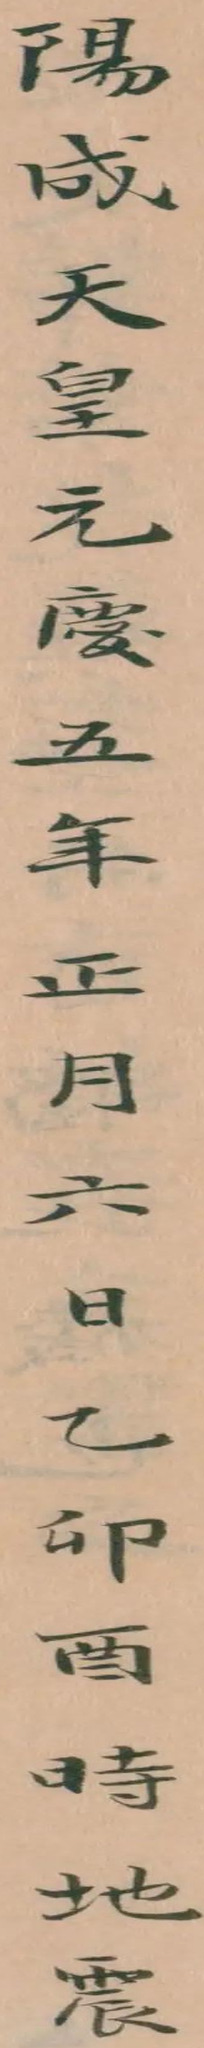陽成天皇元慶五年正月六日乙卯酉時地震
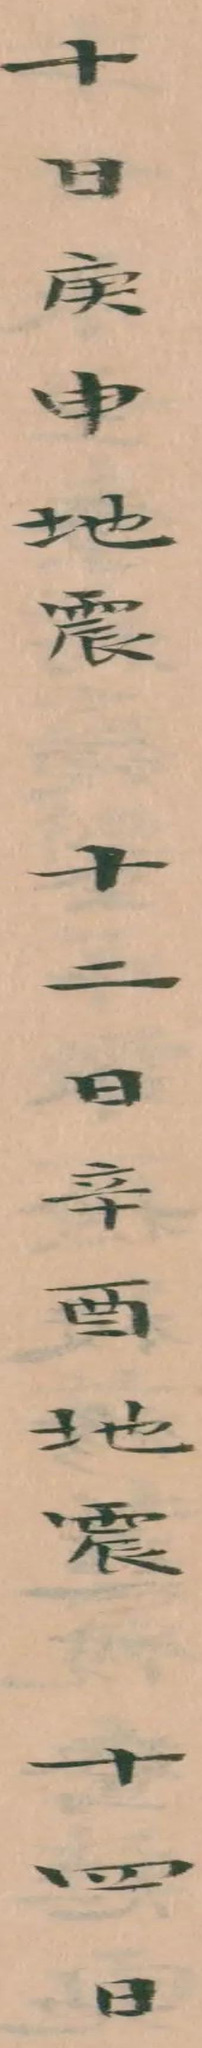十日庚申地震十二日辛酉地震十四日
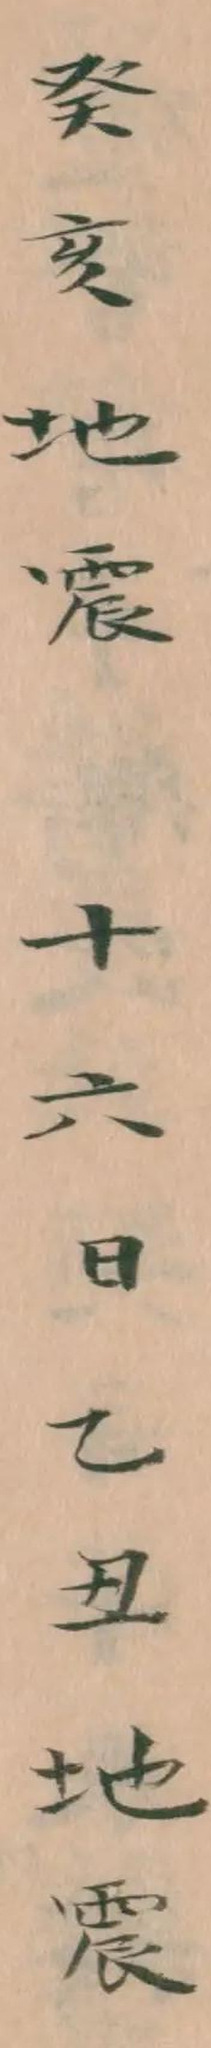癸亥地震十六日乙丑地震
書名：地災撮要. 巻5-6(地震之部)
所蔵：国立国会図書館 National Diet Library, JAPAN
